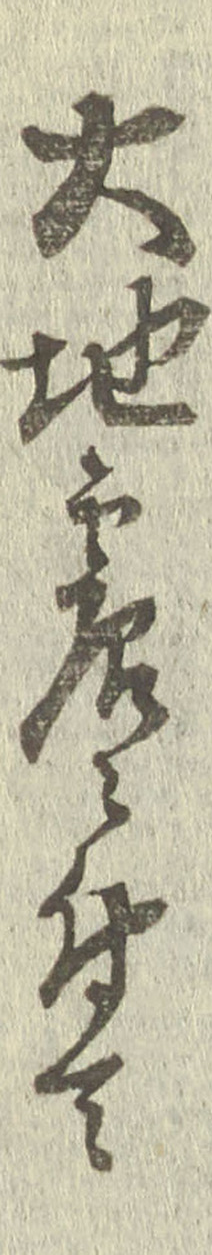大地震ニ付て
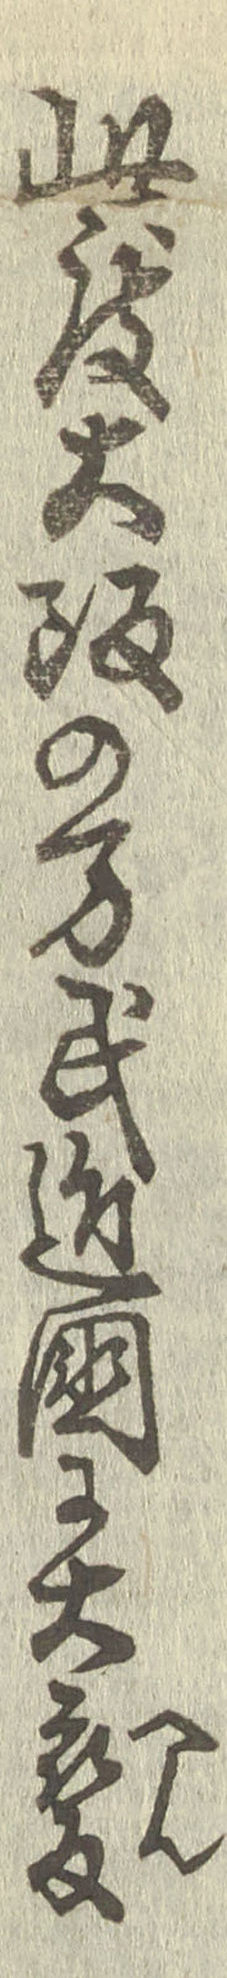此度大阪の万民近国に大変
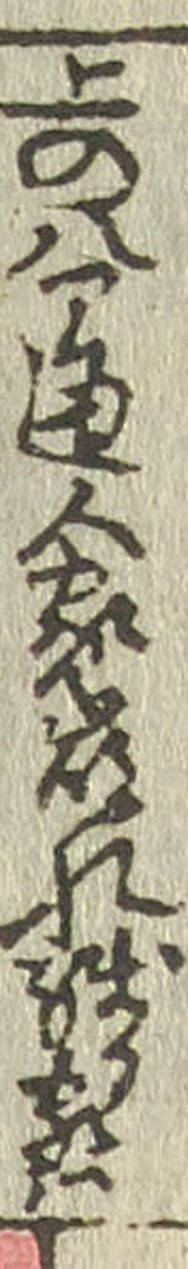上の八部通人家崩れ残り家は
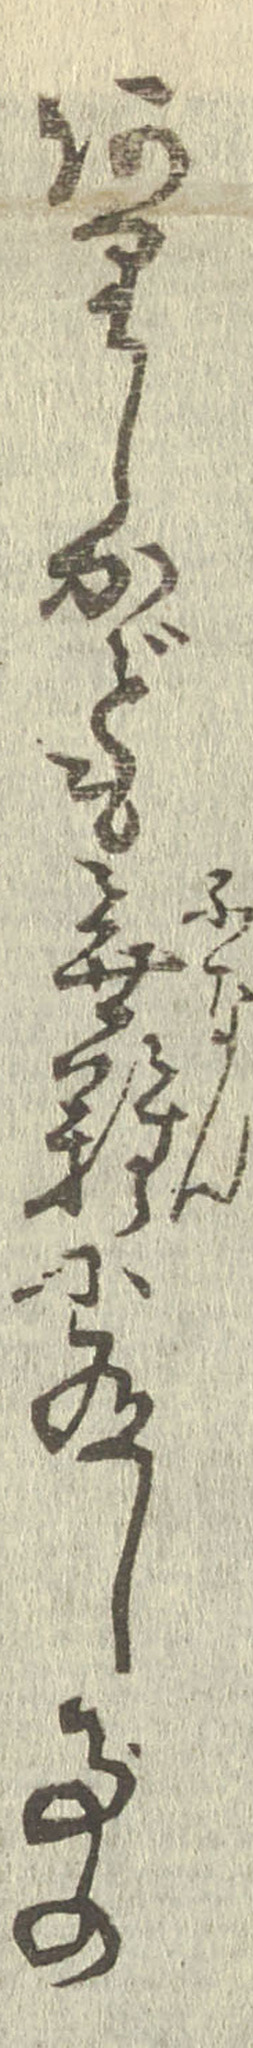ありしかども無難に有し事の
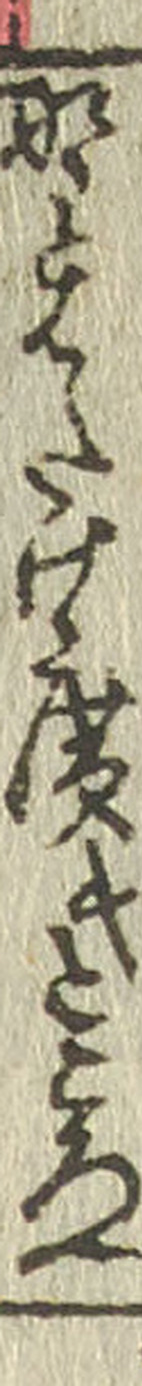野はたけ廣キところへ
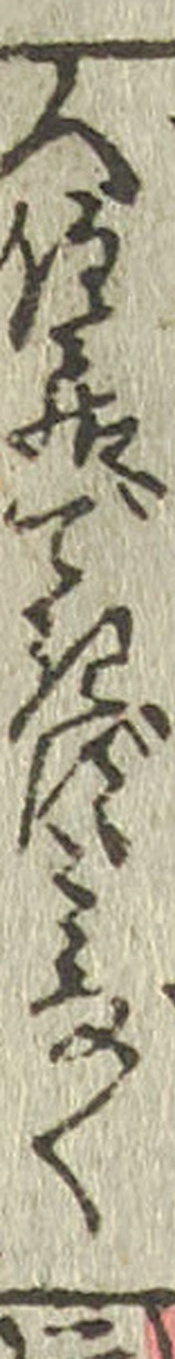人住居できずみな〳〵
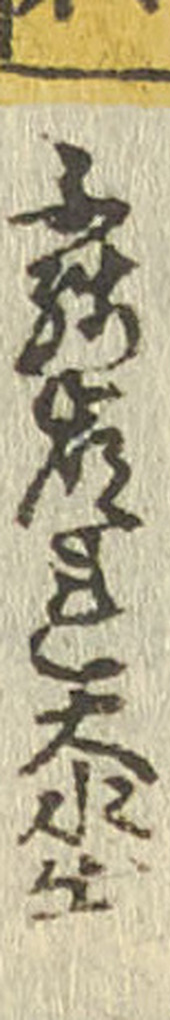不残崩れ大水出
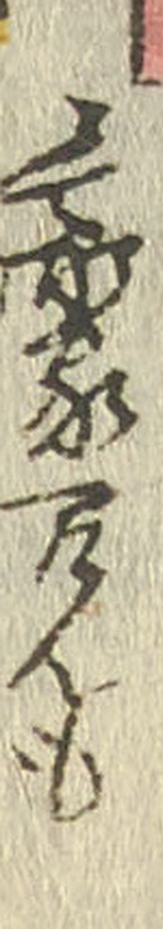にて町家一けんも
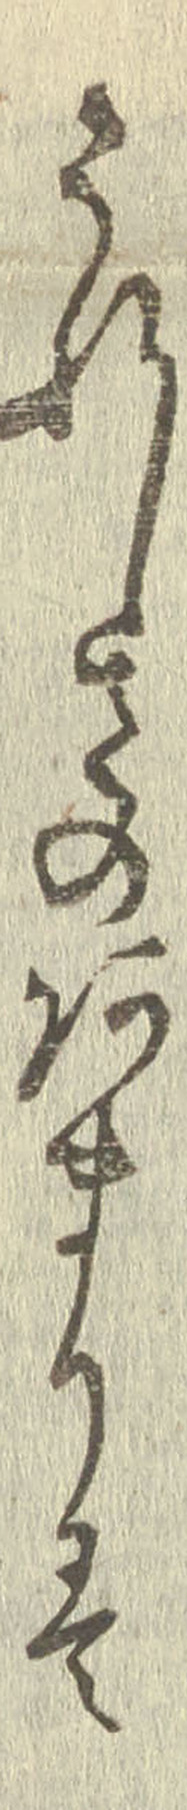うれしさのあまりにて
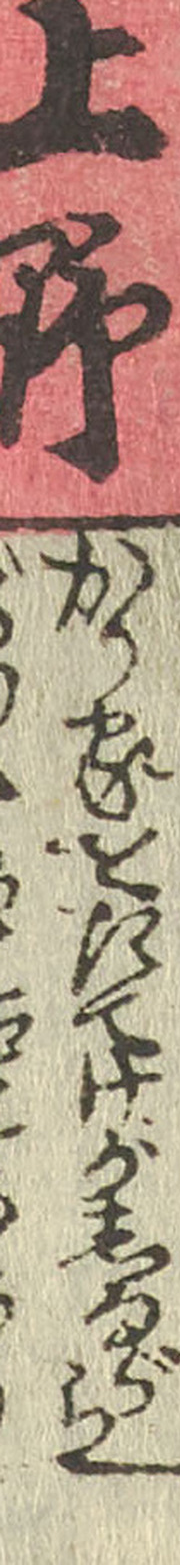かり家をたてけがしながら
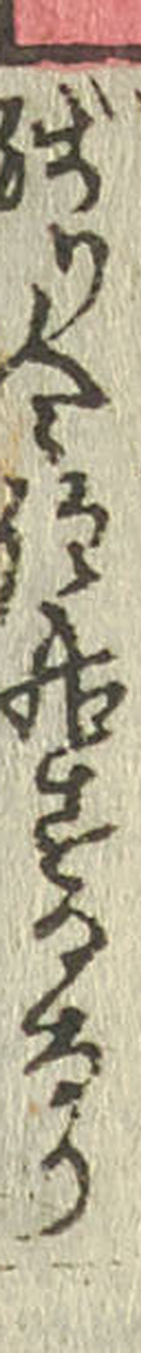残り人〻住居するなり
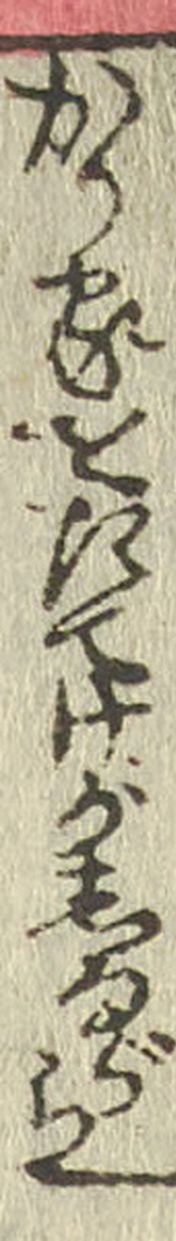かり家をたてけがしながら
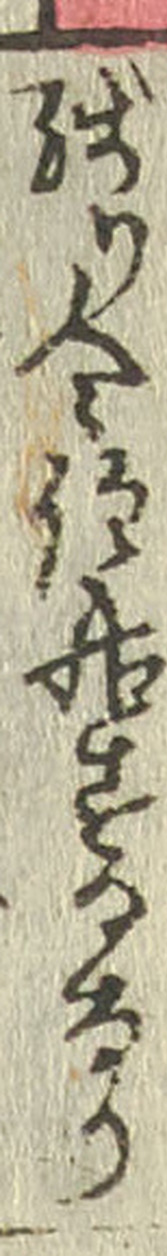残り人〻住居するなり
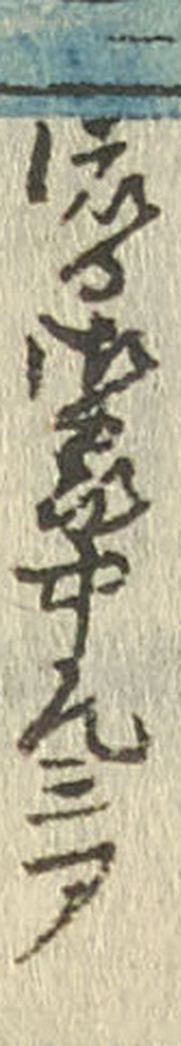流る御家中凡三部
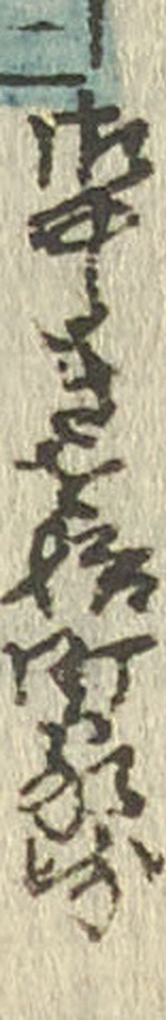御やしきを始町家皆
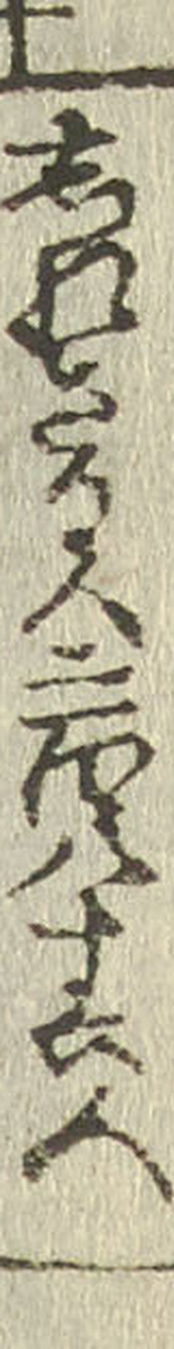しれさる人二百八十六人
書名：大地震早引方角附
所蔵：東京大学総合図書館 General Library in the University of Tokyo, JAPAN
